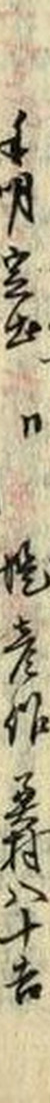手明定出同堤彦作奥村八十吉
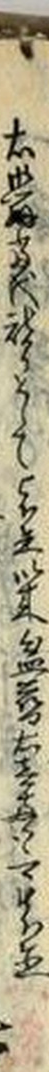右御弁当代替りとして被下置以来盆暮右壱両ツヽ可被下置
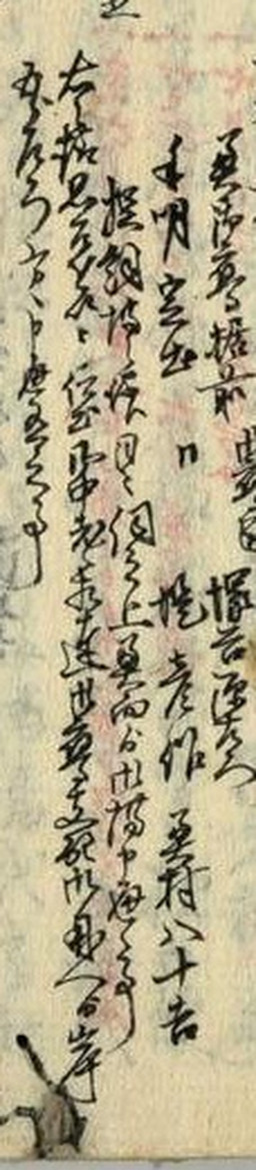捉飼場之儀ハ日々伺之上奥向ゟ御場申通候事
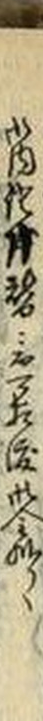御内証引替ニ而可相渡御金掛りへ
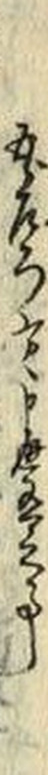五郎左衛門方へ申通有之事
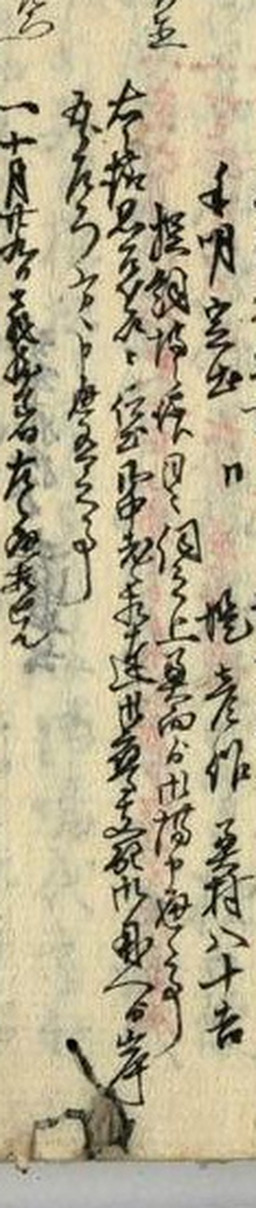右之趣思召を以被仰出御中老へ相達御鷹支配御用人ゟ岸
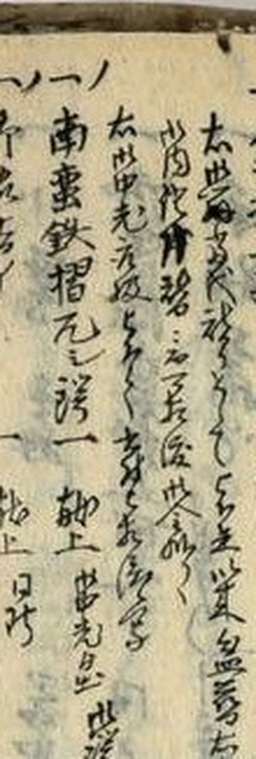右御中老取扱被下之書付被相渡候写
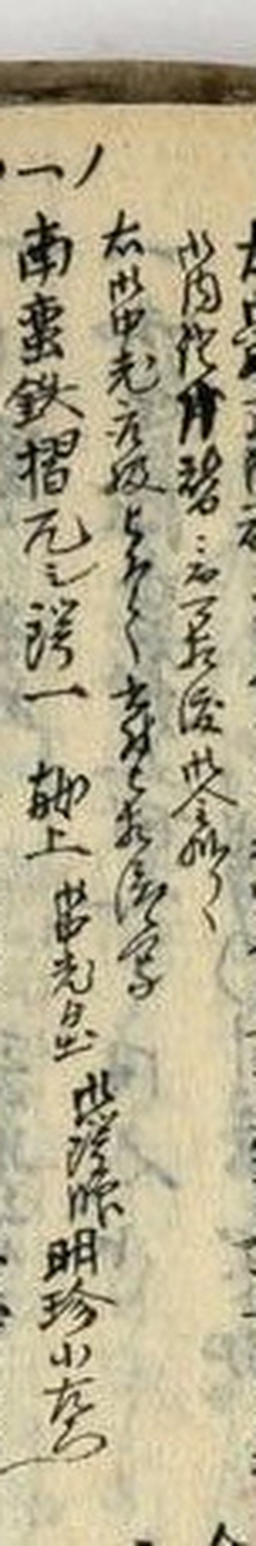一南蛮鉄摺シ鍔一献上御中老ゟ出御鍔師明珍小左衛門
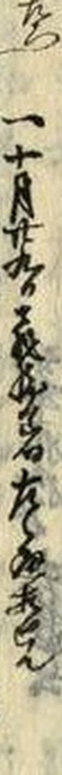一十月廿九日飛脚着左之通相廻ㇽ
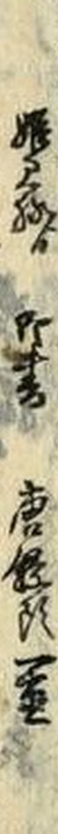姫君様ゟ御書唐饅頭一重
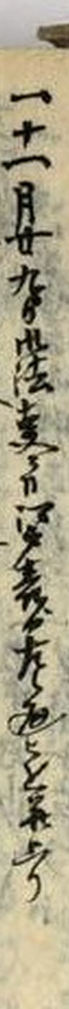一十一月廿九日御法事ニ付江戸表ゟ左之通被進并上り
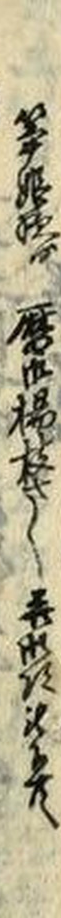筆姫様ゟ暦御楊枝さし并御次被下共
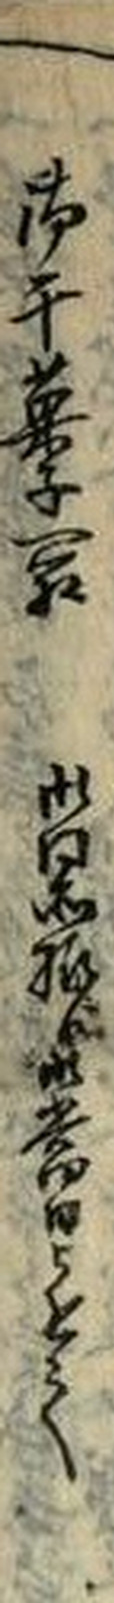御干菓子一箱御同所様ゟ御当日被進之
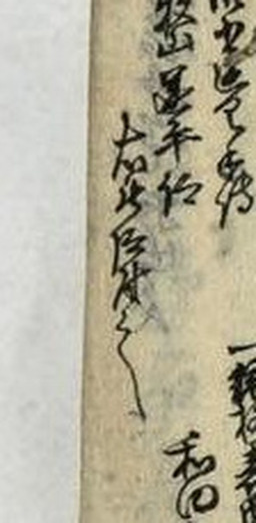右被仰付之

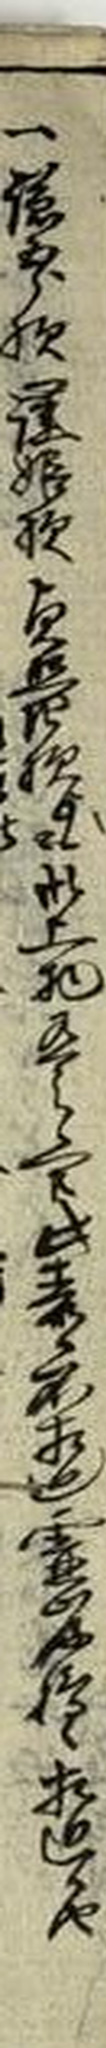一謙五郎様謹姫様貞照院様ゟ御上物有之候へ共此表へ不相廻霊岸嶋へ相廻候由
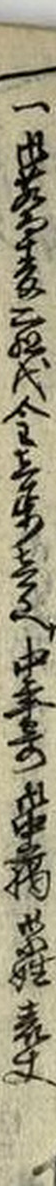一御蕎麦二組代金壱歩壱匁同中年寄御中臈御小姓表使
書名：少傅日録抄（斉承付側向頭取日記、在国）
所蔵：福井県文書館 Fukui Prefectural Archives
